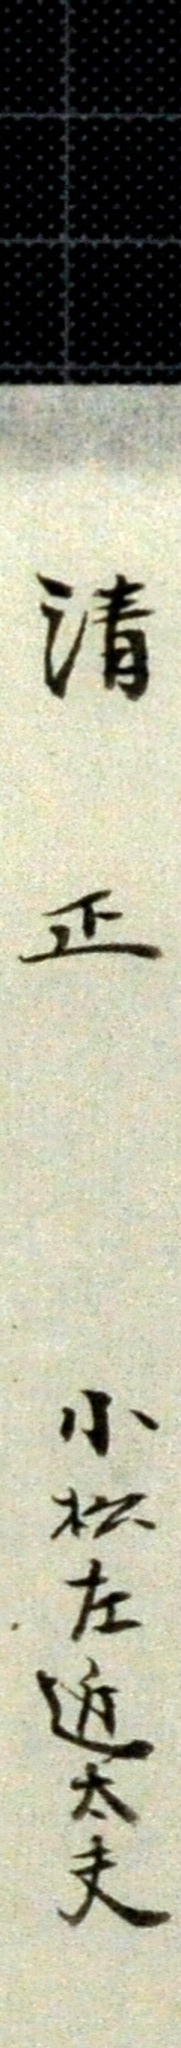重森小松左京太夫
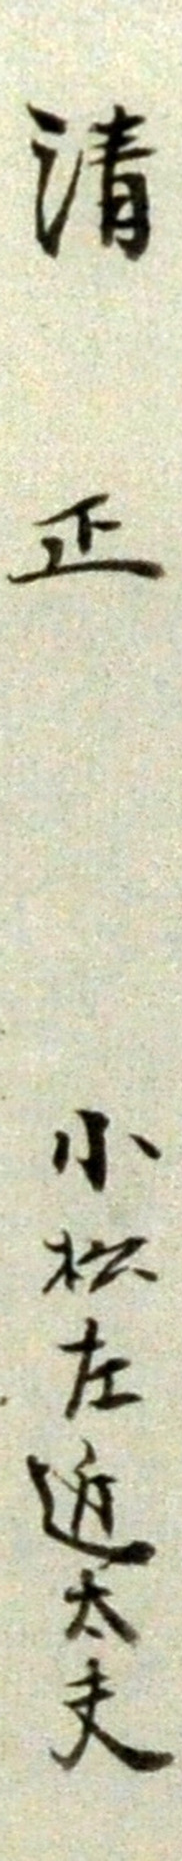重森小松左京太夫
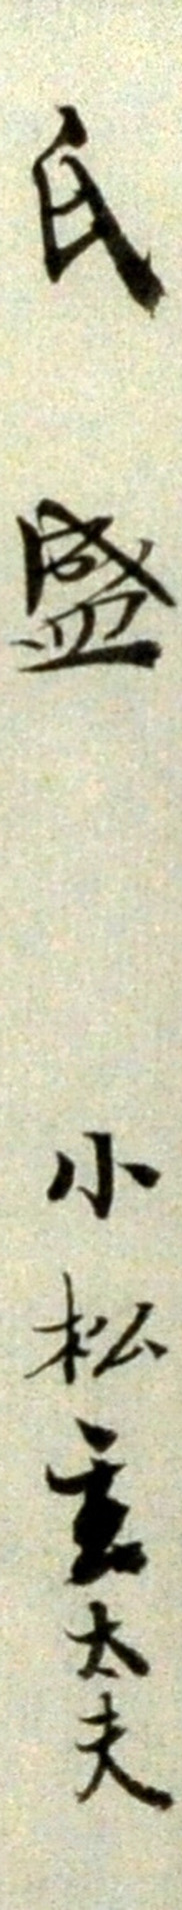氏盛小松主太夫
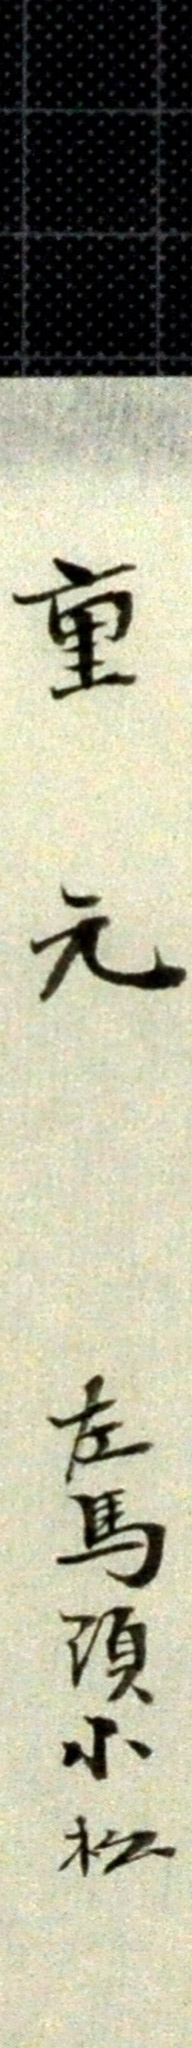重元左馬頭小松
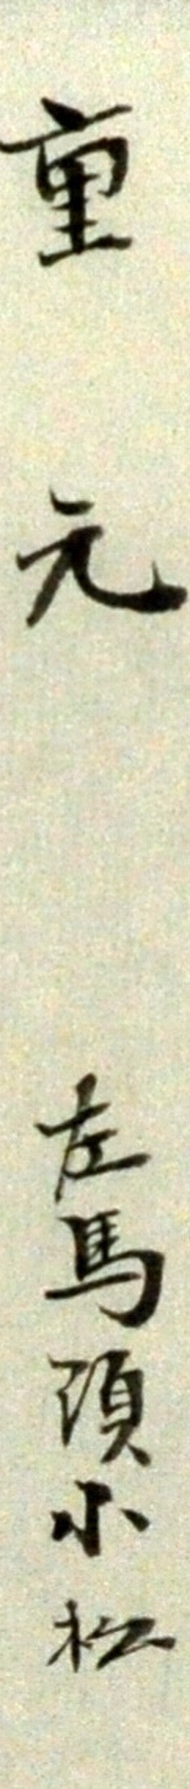重元左馬頭小松
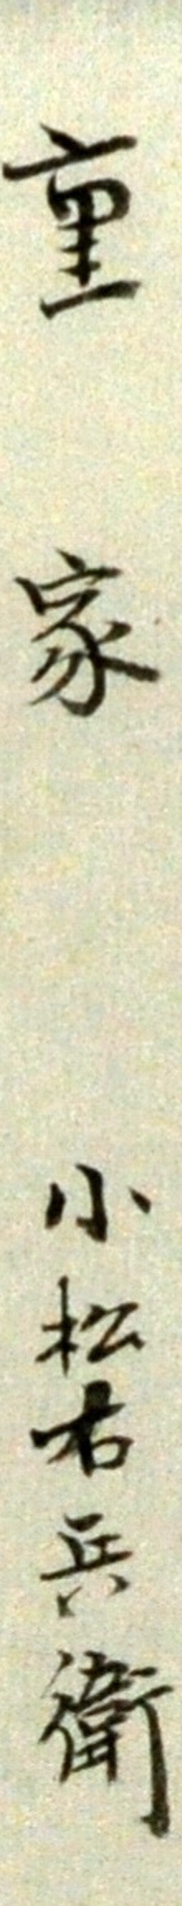重家小松右兵衛
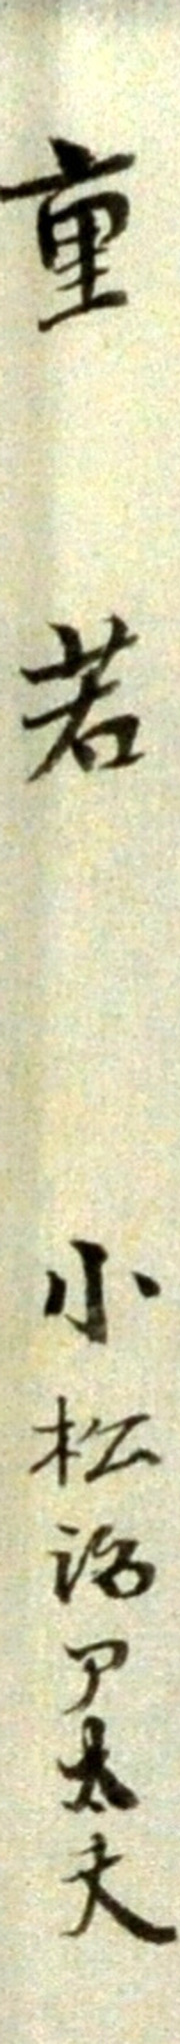重若小松治郎太夫
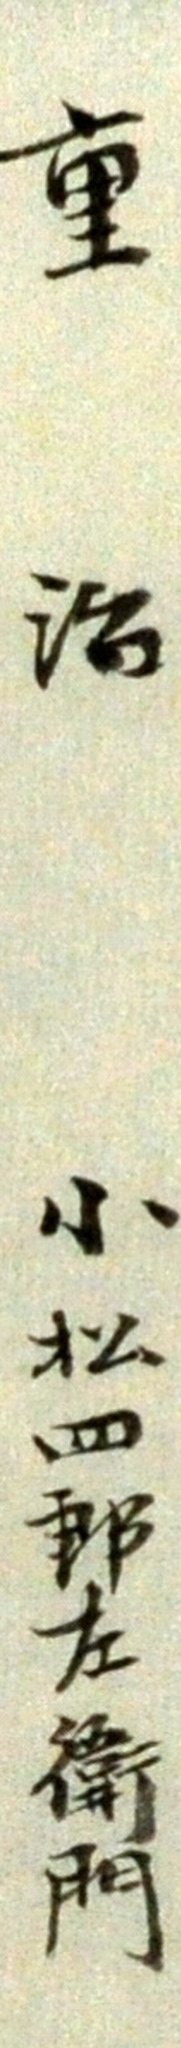重治小松四郎左衛門
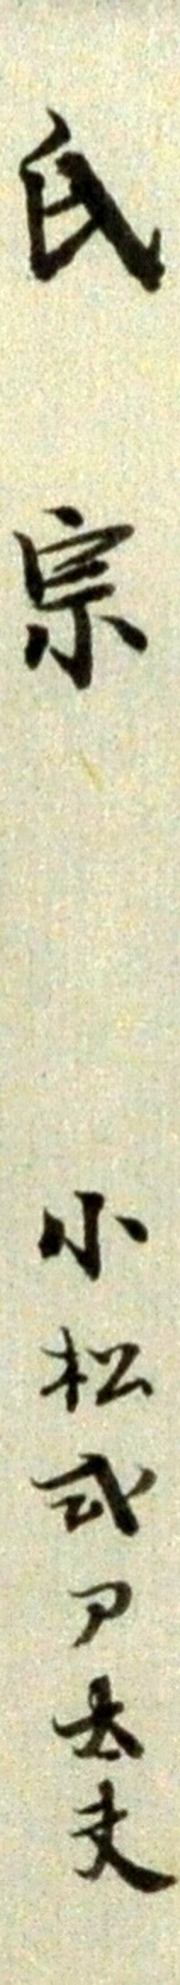氏宗小松式部太夫
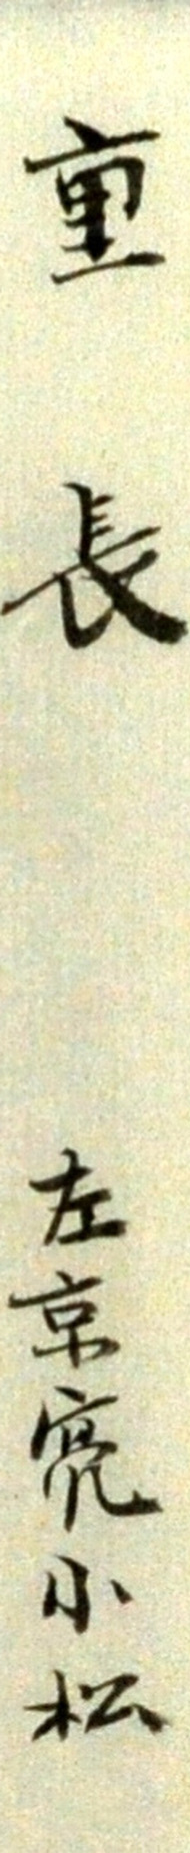重長左京亮小松
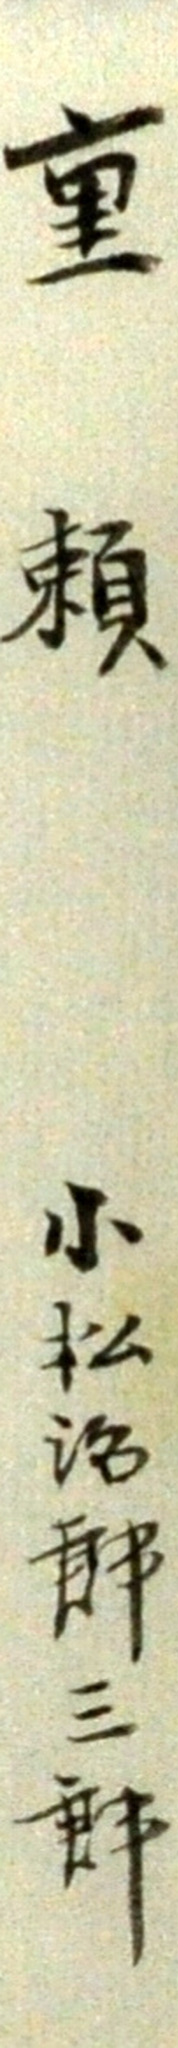重頼小松治郎三郎
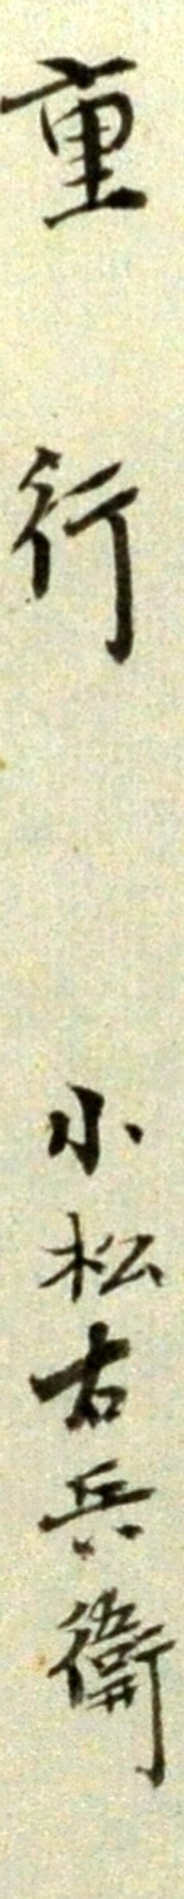重行小松右兵衛
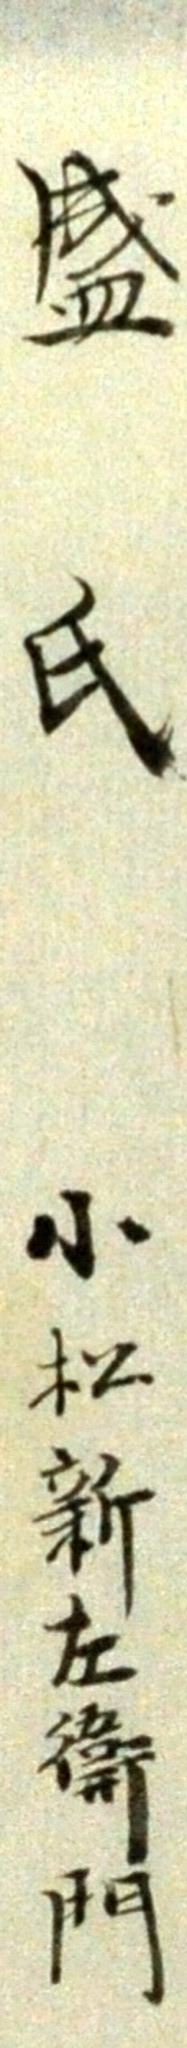盛氏小松新左衛門
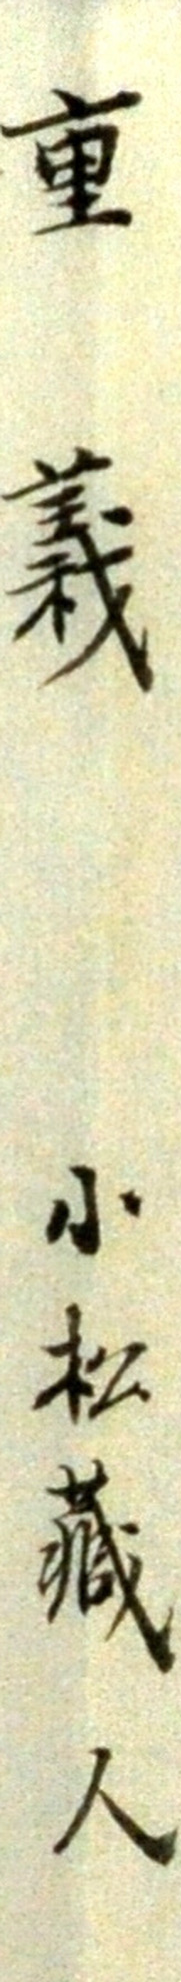重義小松蔵人
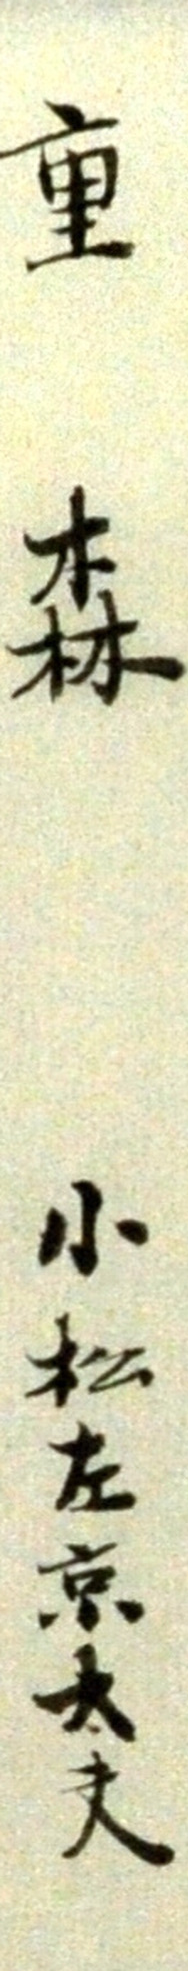重森小松左京太夫
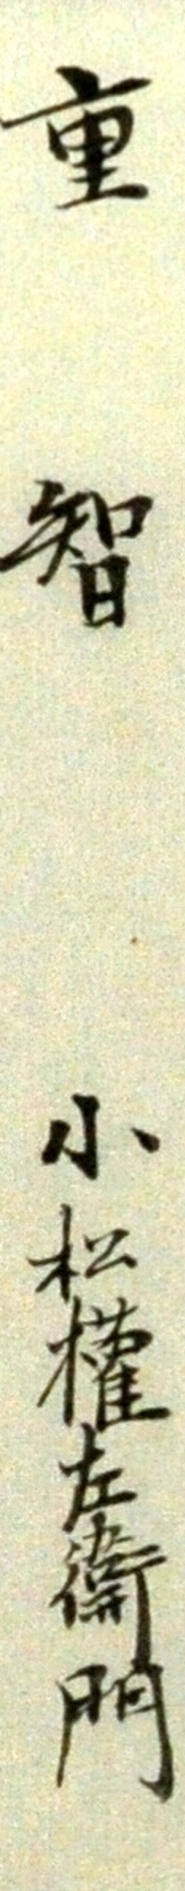重智小松権左衛門
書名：小松家古系図写・一通、浦村家筋帳抜粋・一通
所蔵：伊那市立高遠町図書館・合同会社AMANE
